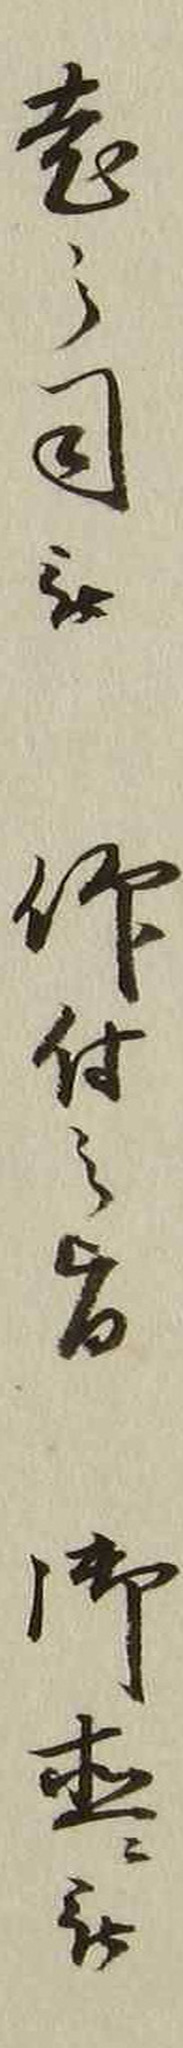老之司被仰付之旨御直に被
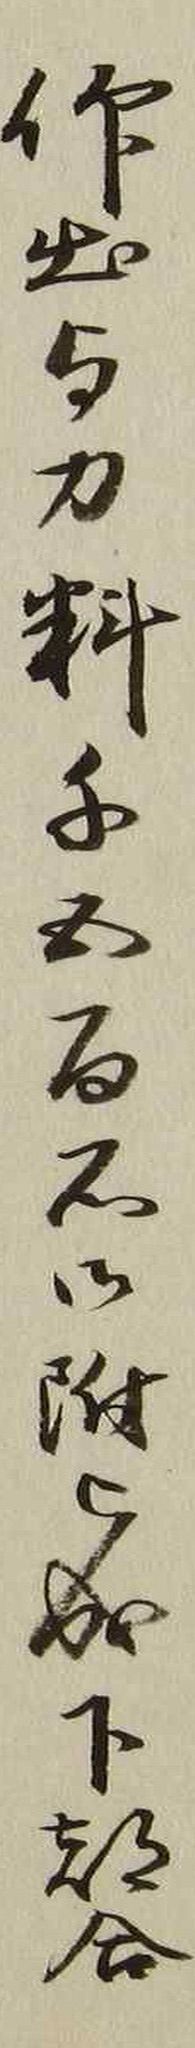仰出与力料千五百石御附被成下都合
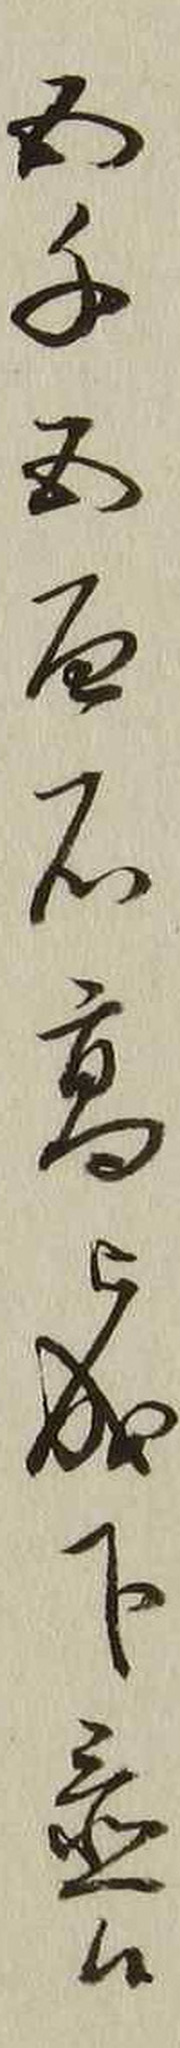五千五百石高被成下置候
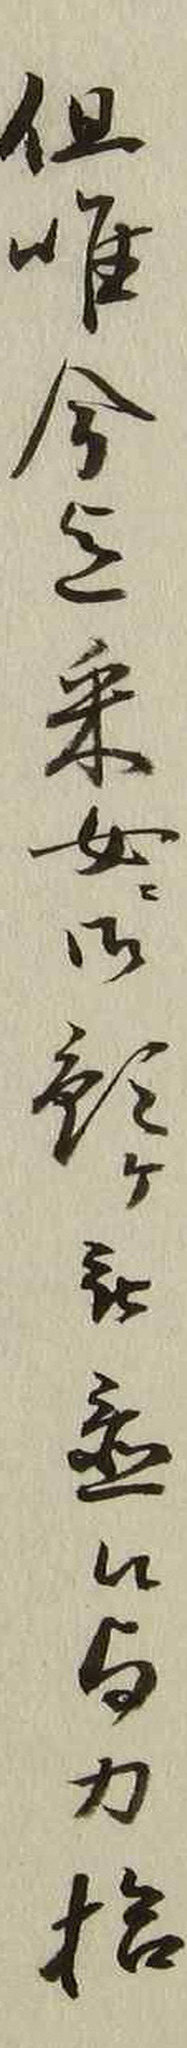但唯今迄采女に御預ヶ被置候与力拾
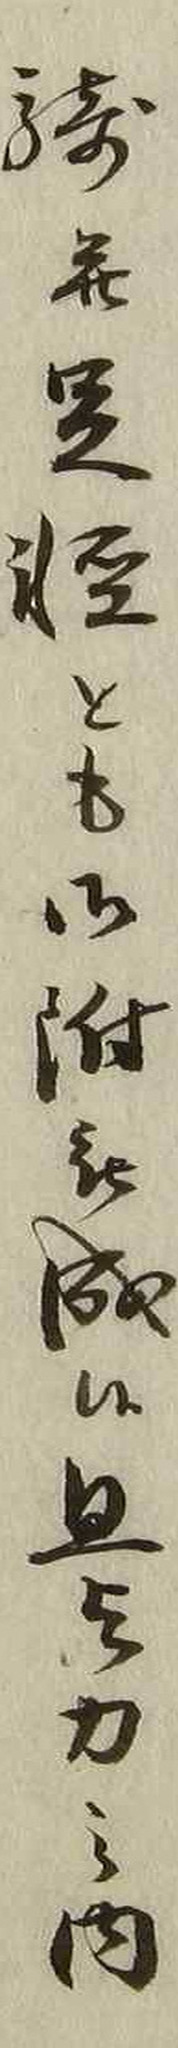騎并足軽とも御附被成候且与力之内
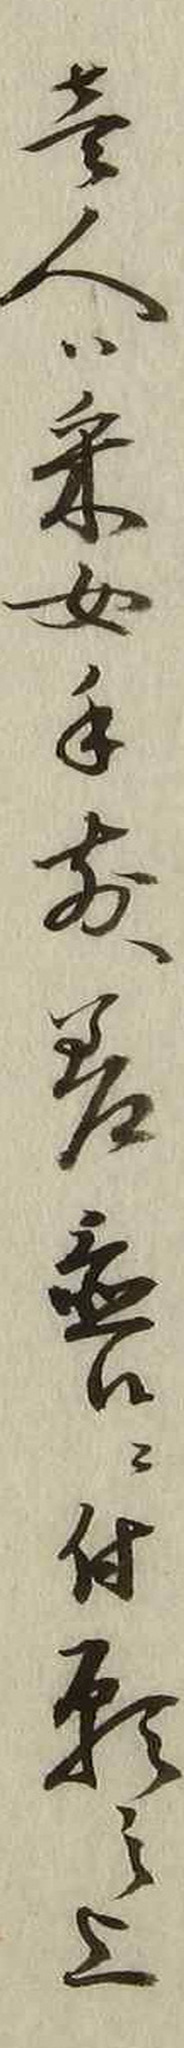壱人は采女手前へ差置候に付願之上
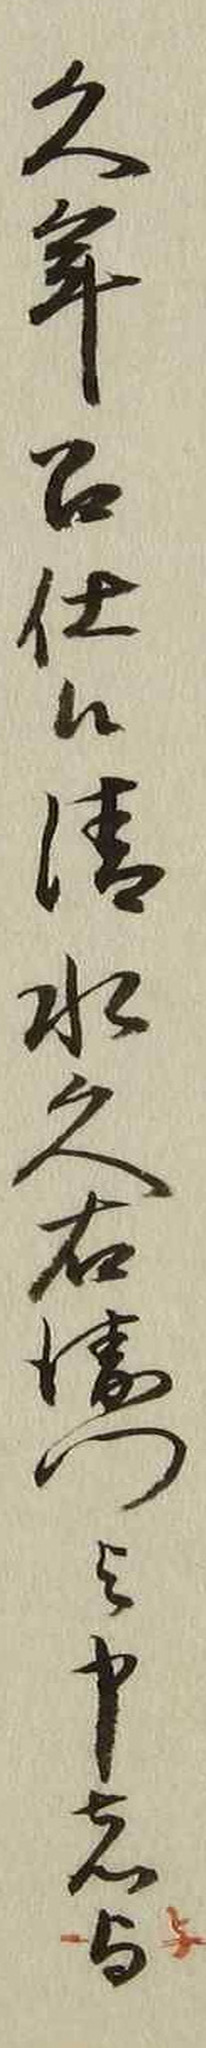久年召仕候清水久右衛門と申者与
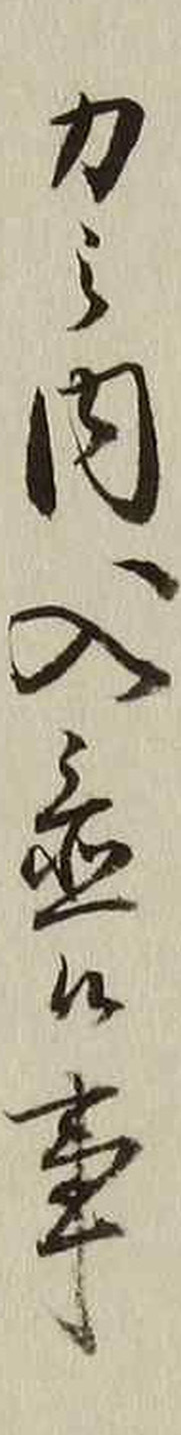力之内へ入置候事
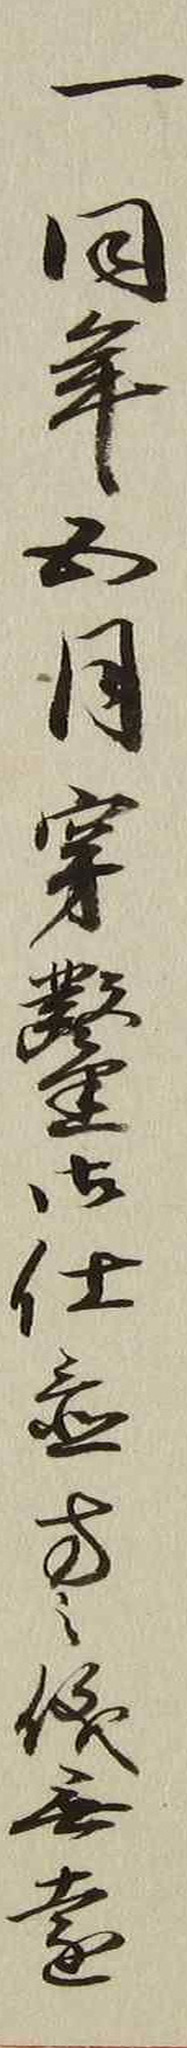一同年五月穿鑿御仕置方之儀無遠
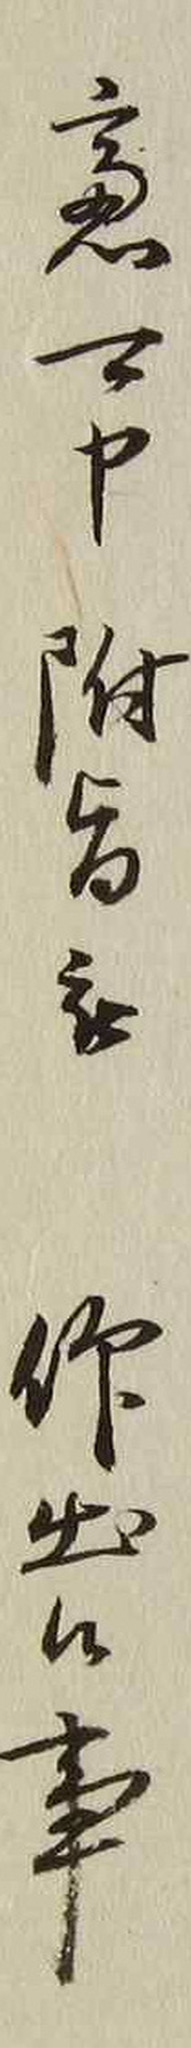慮可申附旨被仰出候事
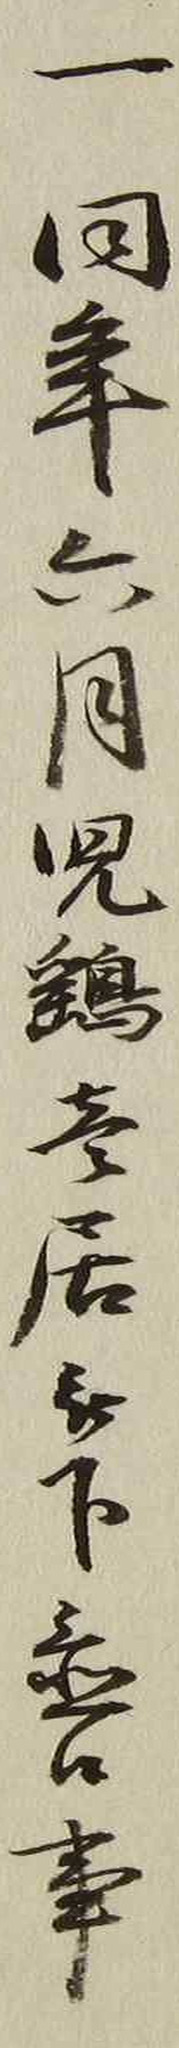一同年六月児鷂一居被下置候事
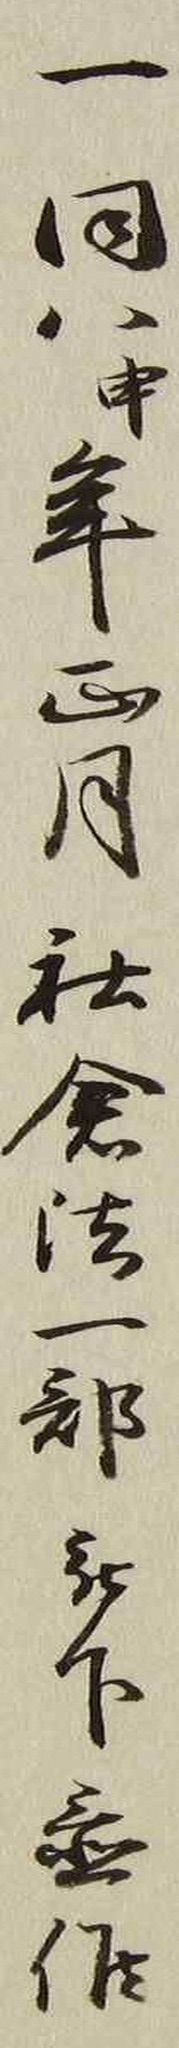一同八申年正月社倉法一部被下置候
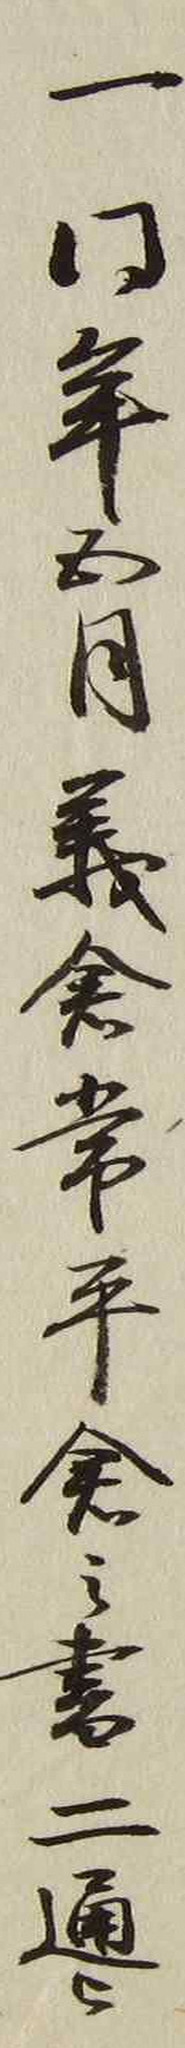一同年五月義倉常平倉之書二通被
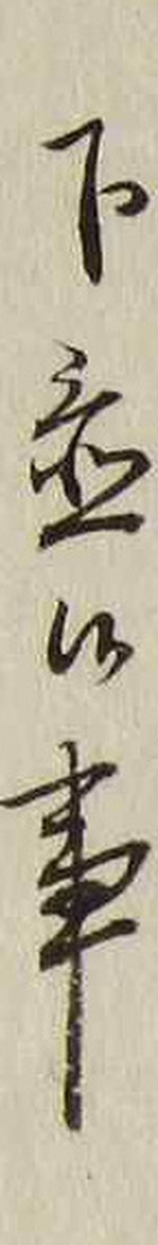下置候事
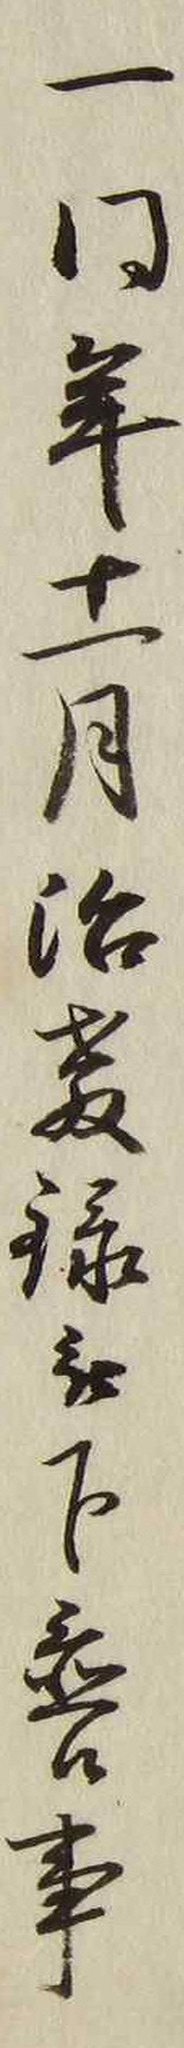一同年十一月治教録被下置候事
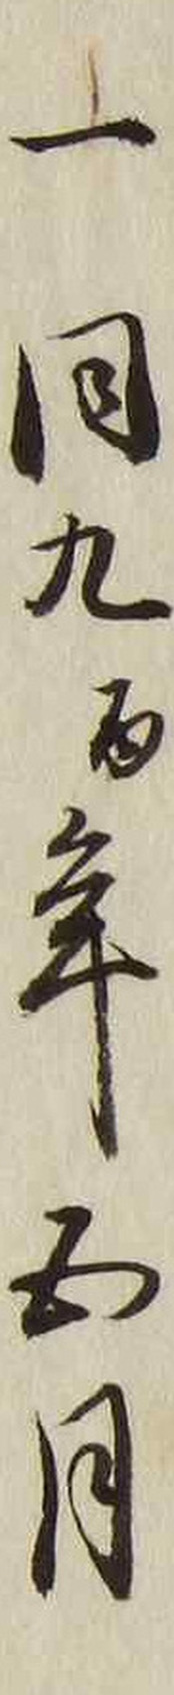一同九酉年五月
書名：諸士系譜　巻之125　た之部1
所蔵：会津若松市立会津図書館
